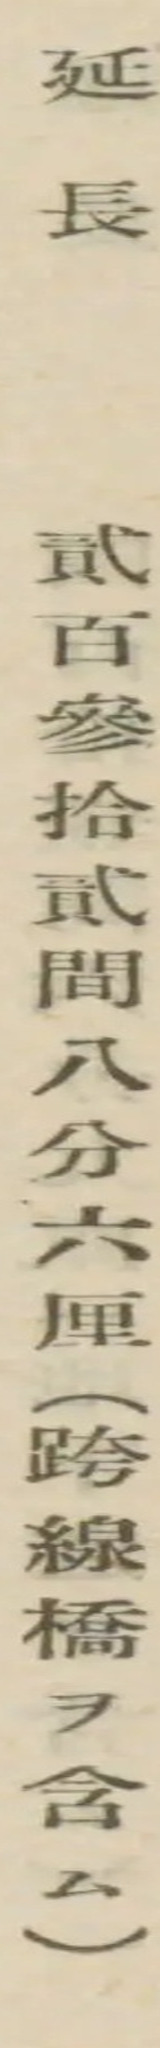延長二百十二間八分六厘(跨線橋ヲ含ム)
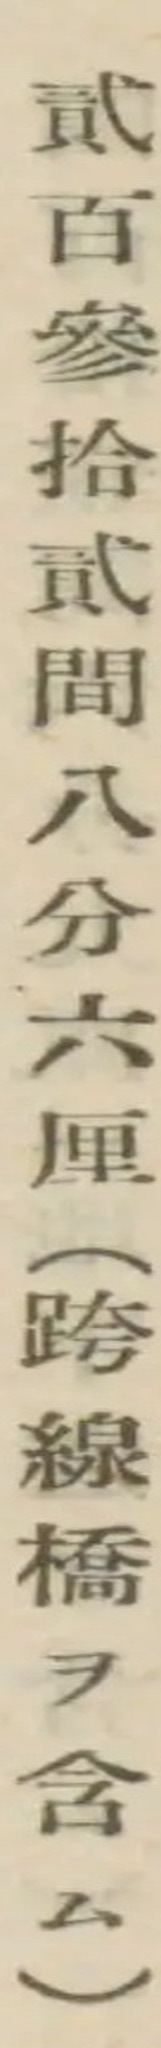延長二百十二間八分六厘(跨線橋ヲ含ム)
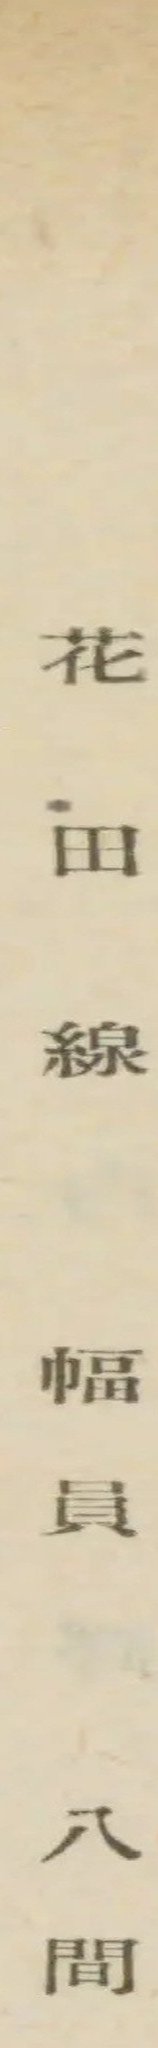花田線幅員八間
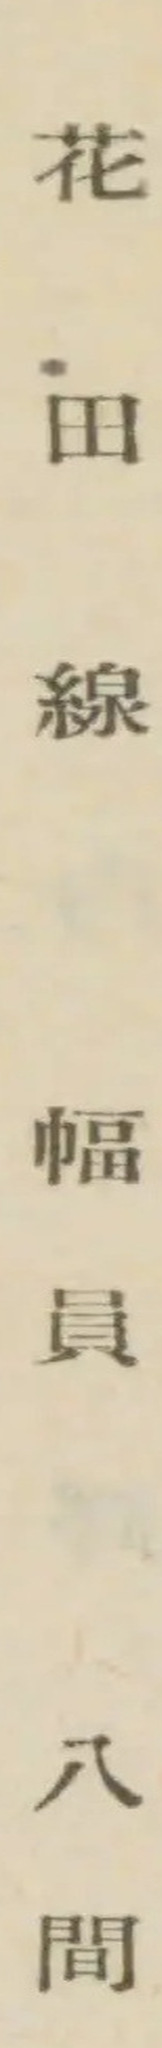花田線幅員八間
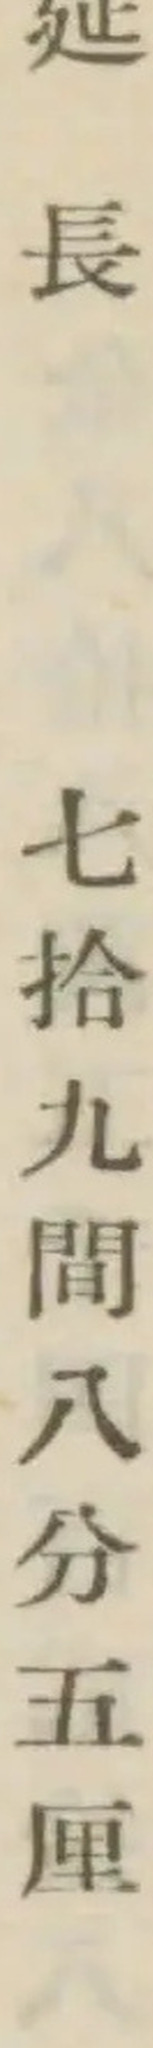延長七十九間八分五厘
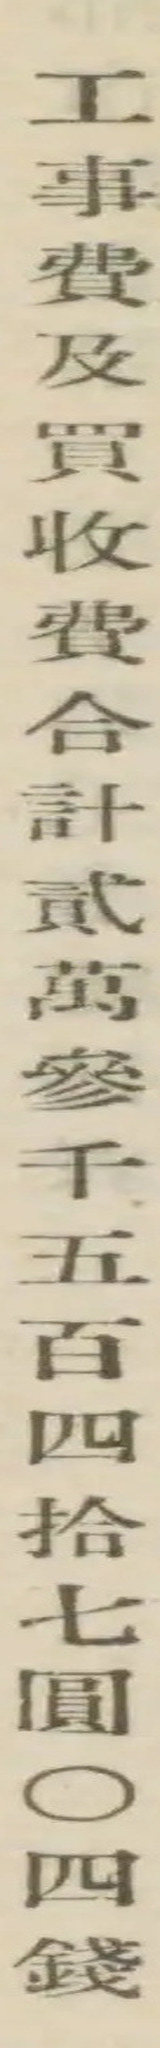工事費及買収費合計二万三千五百四十七円○四銭
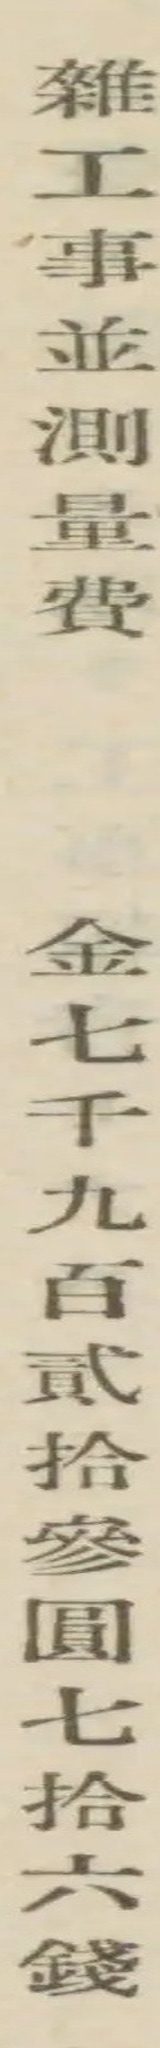難工事並測量費金七千九百二十三円七十六銭
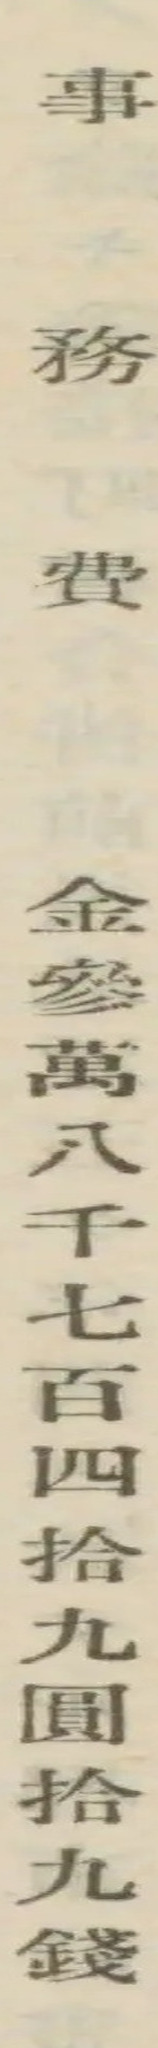事務費金三万八千七百四十九円十九銭
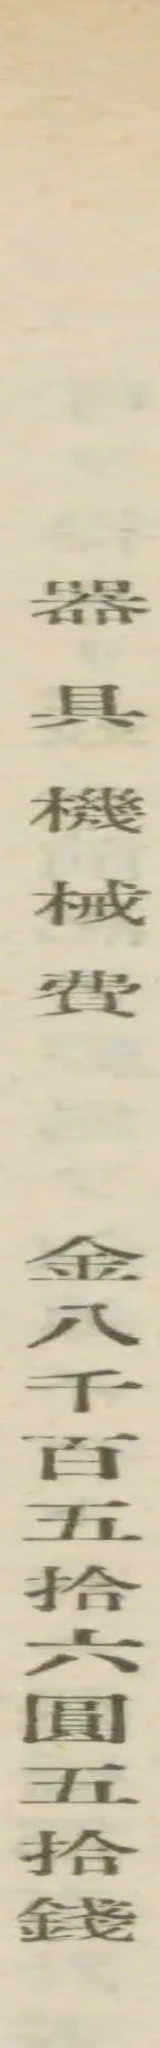器具機械費金八千百五十六円五十銭
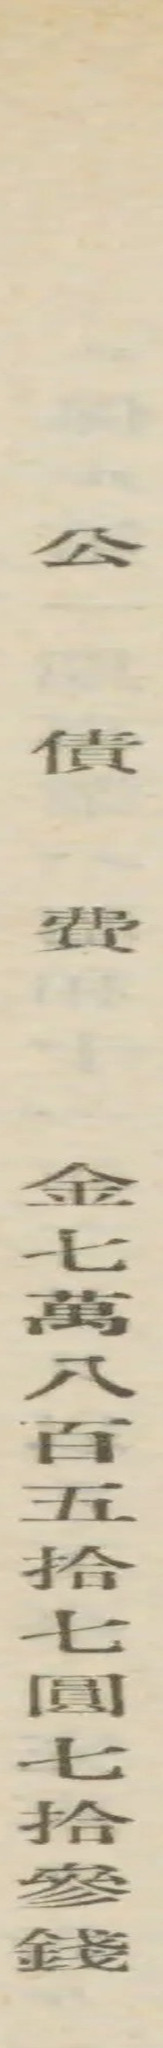公債費金七万八百五十七円七十三銭
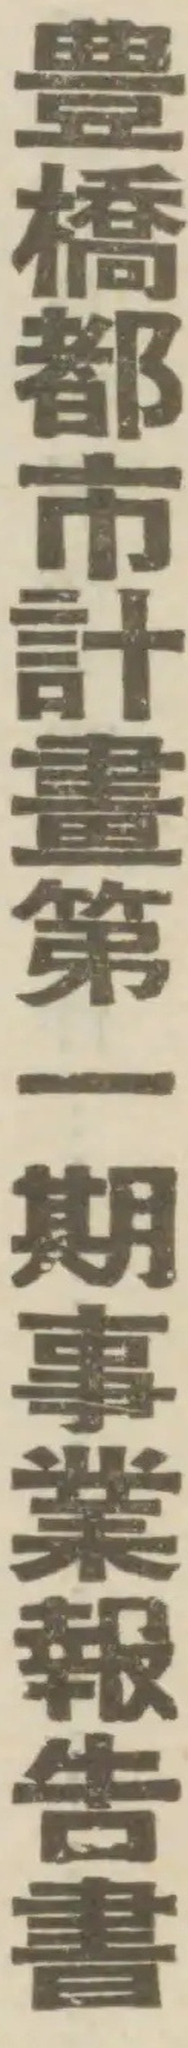豊橋都市計画第一期事業報告書
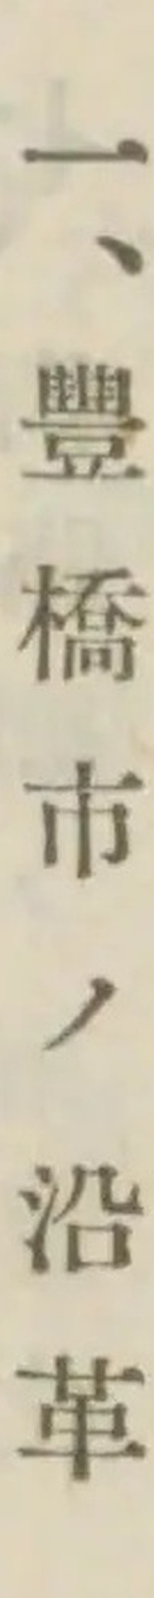一、豊橋市ノ沿革
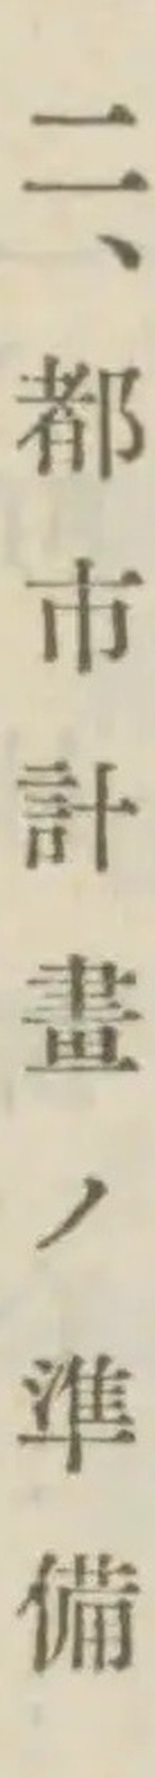二、都市計画ノ準備
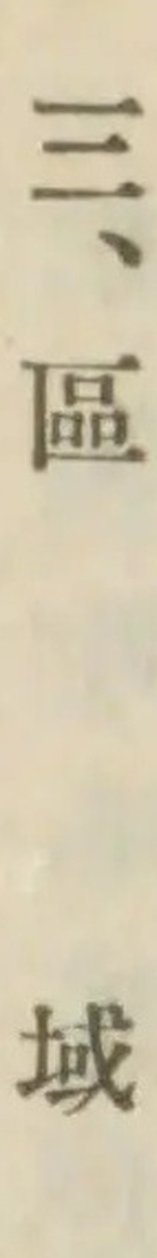三、区域

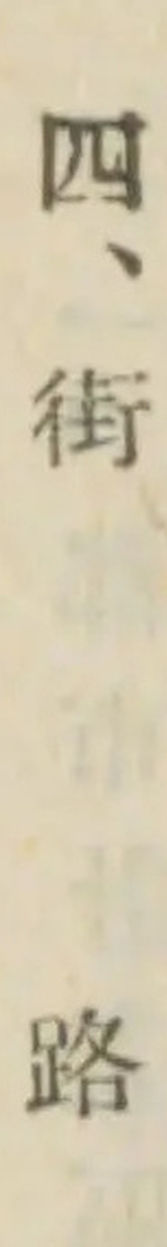四、街路
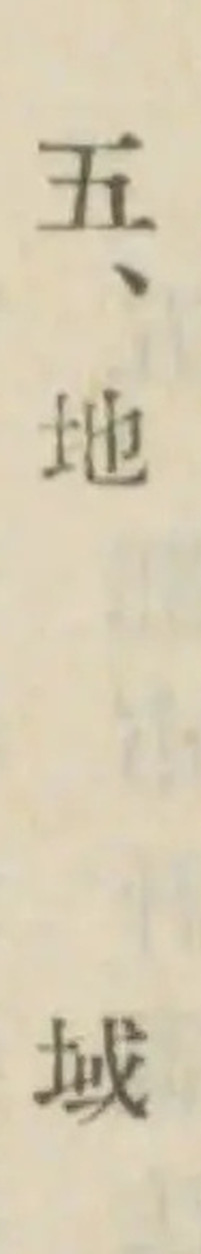五、地域
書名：豊橋市都市計画第一期事業報告書
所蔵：国立国会図書館 National Diet Library, JAPAN
